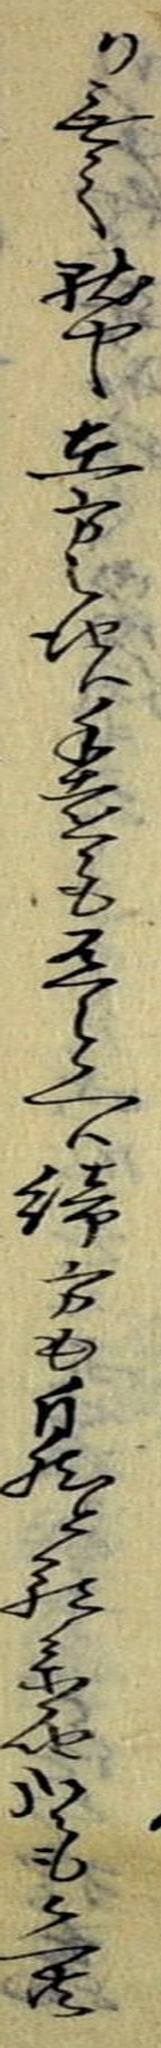り無之就中在方之儀は手遠にも有之候へは締方も自然と難参由哉にも候へ共
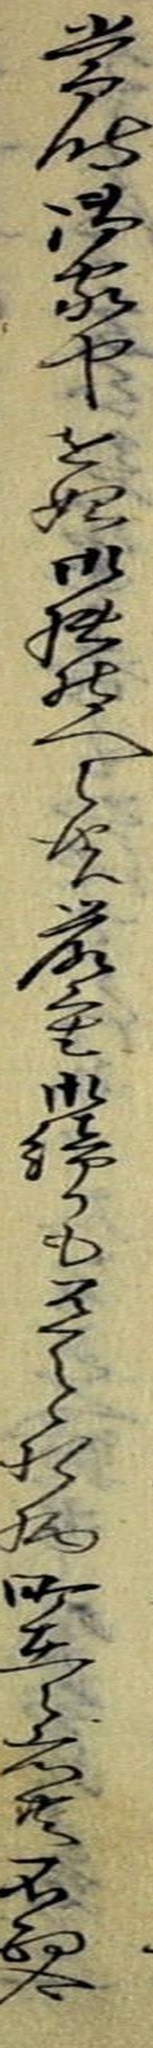当時御家中を始御扶持人之儀は玄重御締りも有之候折柄町在之者共不釣合
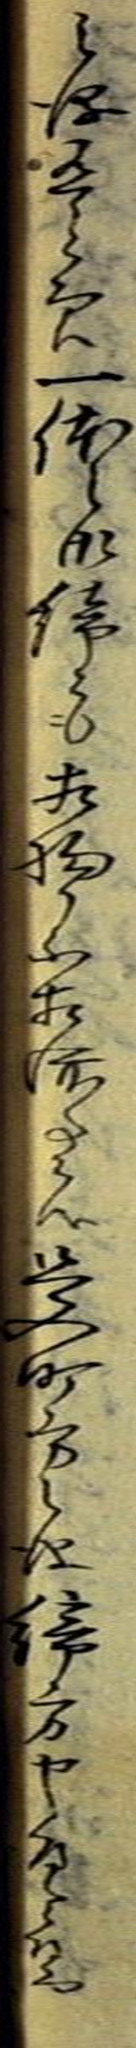之儀有之候而は一体之御締にも相拘り不相済事に候且又町方之儀締方申付候に付而
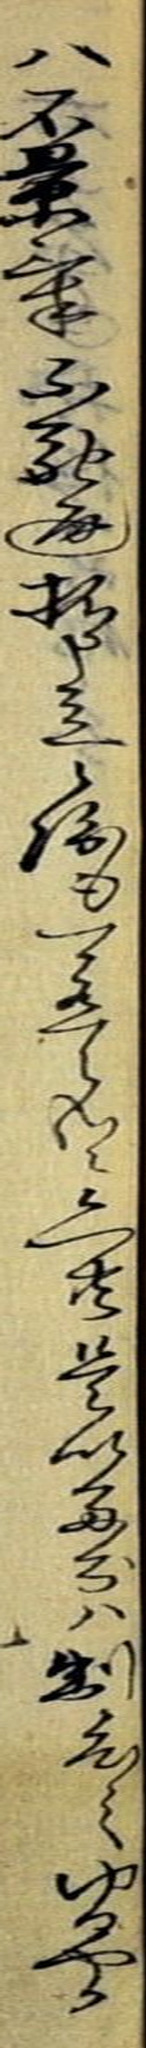は不景気不融通抔申立候儀も可有之哉に候へ共是以多分は制度之ゆるやか
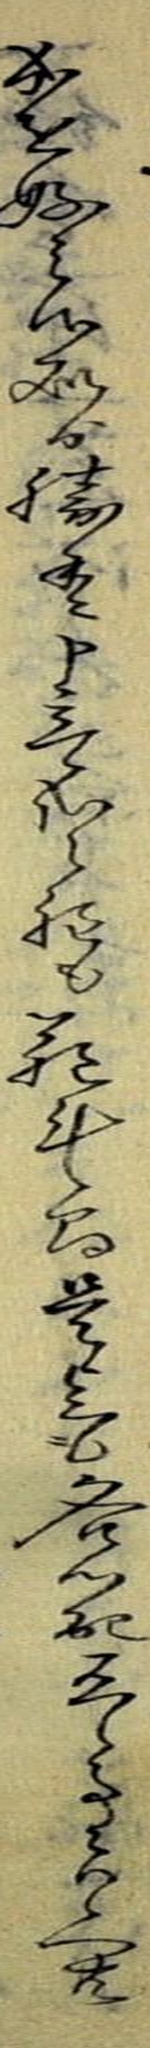成を好ミ候処ゟ勝手に申立候哉之程も難斗候間是迄も各心配有之事には候へ共
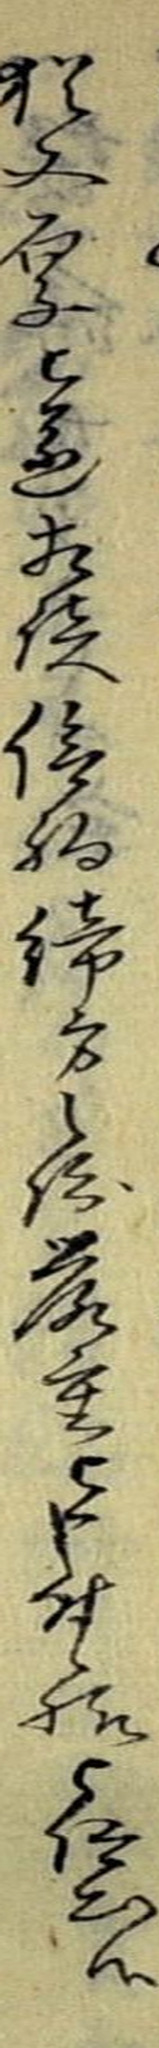猶又厚被遂相談倹約締方之儀厳重被申付候様被仰出候
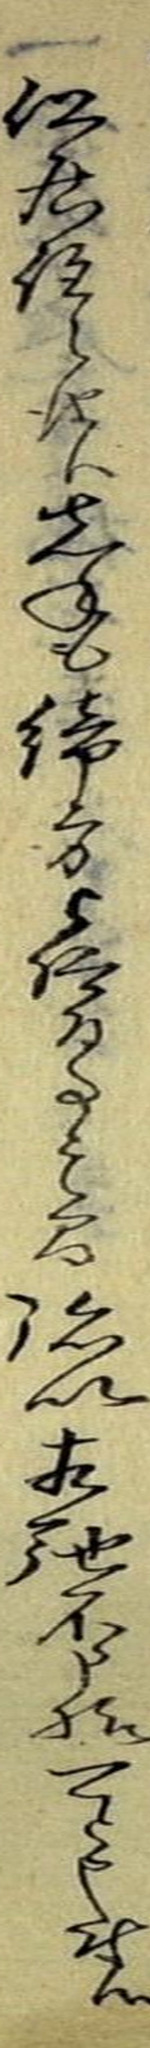但居住之儀は先年も締方被仰付事に候間弥以相弛不申様可被申
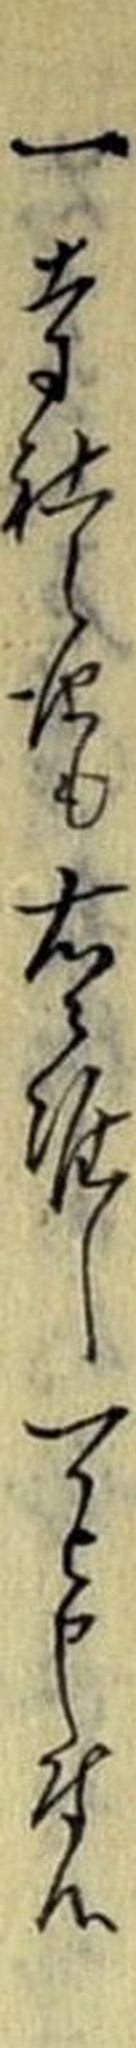一寺社之儀も右に准し可被申付候
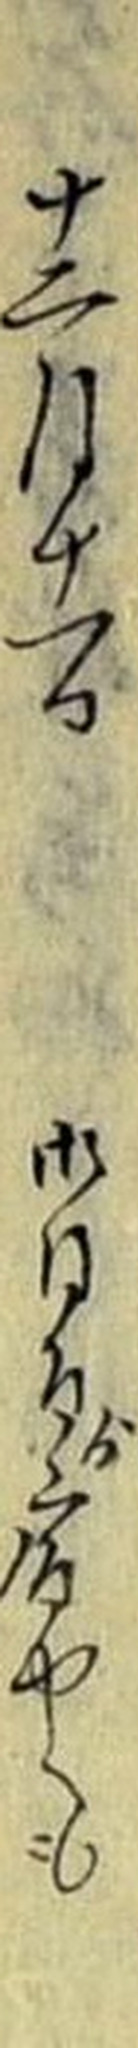十二月十一日御目付ゟ府中へも
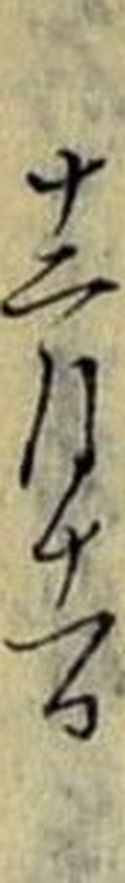十二月六日
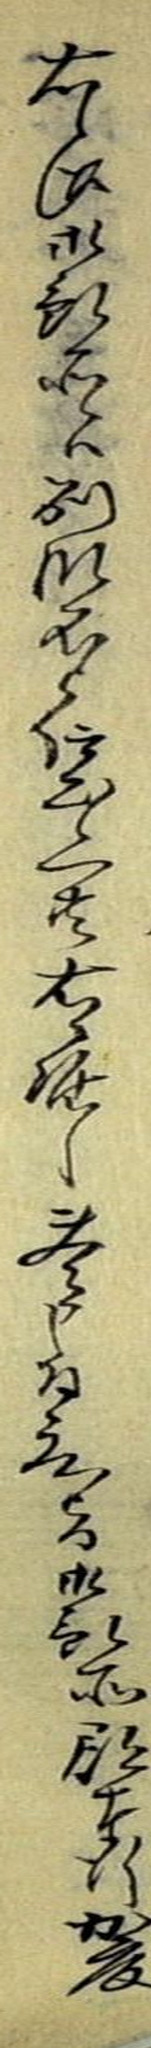右之趣御預所へは別段不被仰出候へ共右に准し夫々申付度旨御預所郡奉行加藤
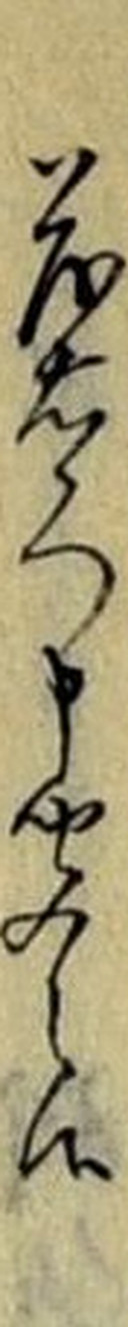茂右衛門申聞之候
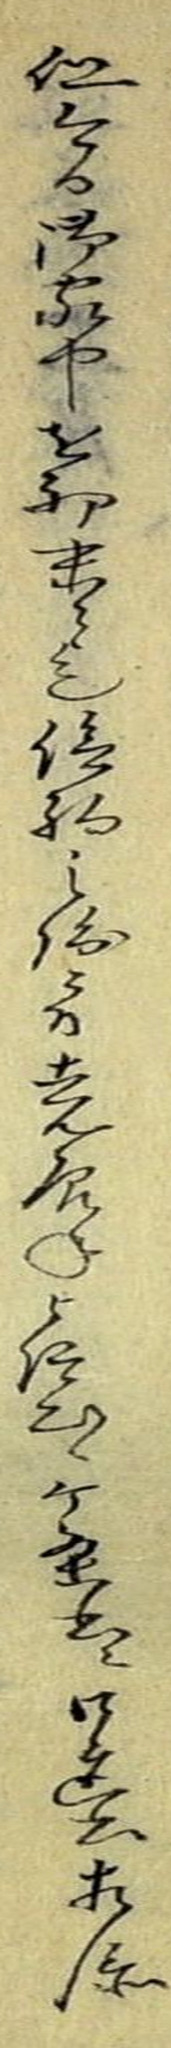但今日御家中を初末々迄倹約之儀に付去ル辰年被仰出候ヶ条書に口達書相添
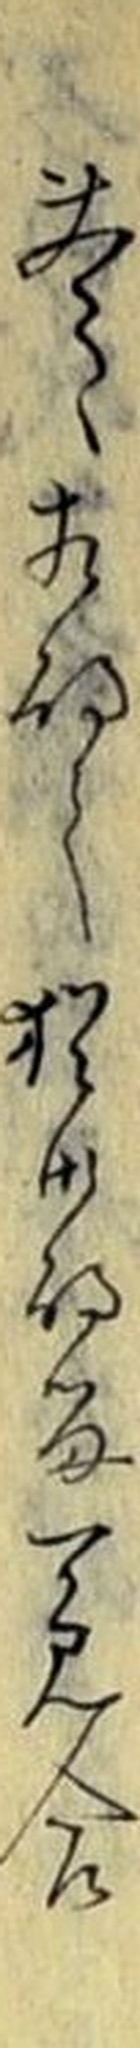夫々へ相触之猶御触留可見合
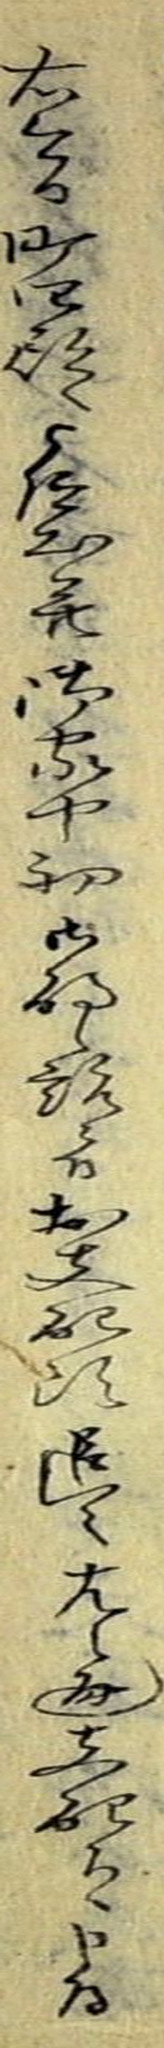右今日町四郡へ被仰出井御家中初御触之趣に付於支配頭追々左之通支配下へ申付
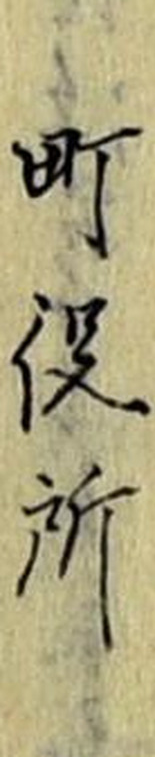町役所
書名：命令之部 六
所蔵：福井県文書館 Fukui Prefectural Archives
